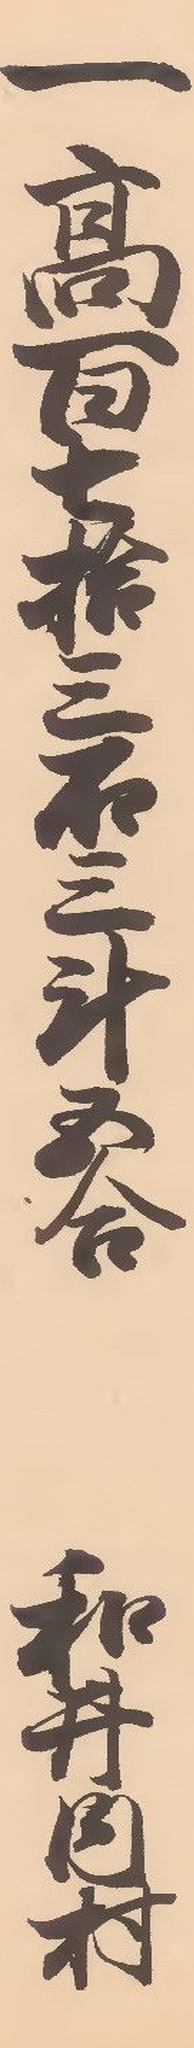一高百七拾三石三斗五合和井内村
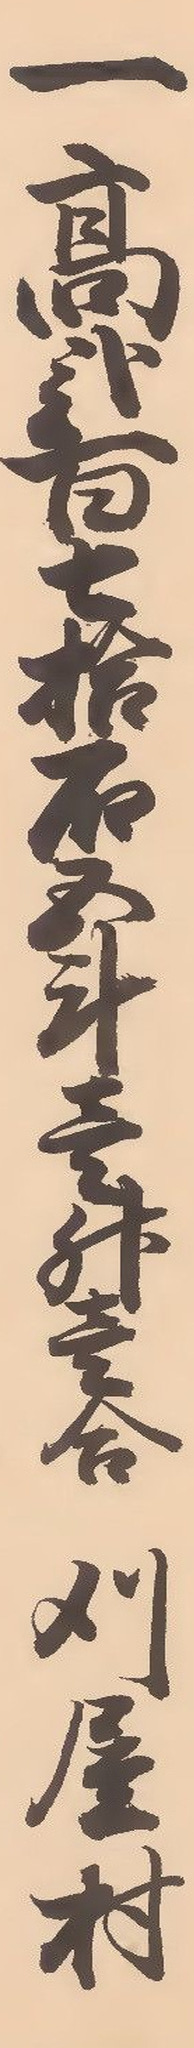一高弐百七拾石五斗壱升壱合刈屋村
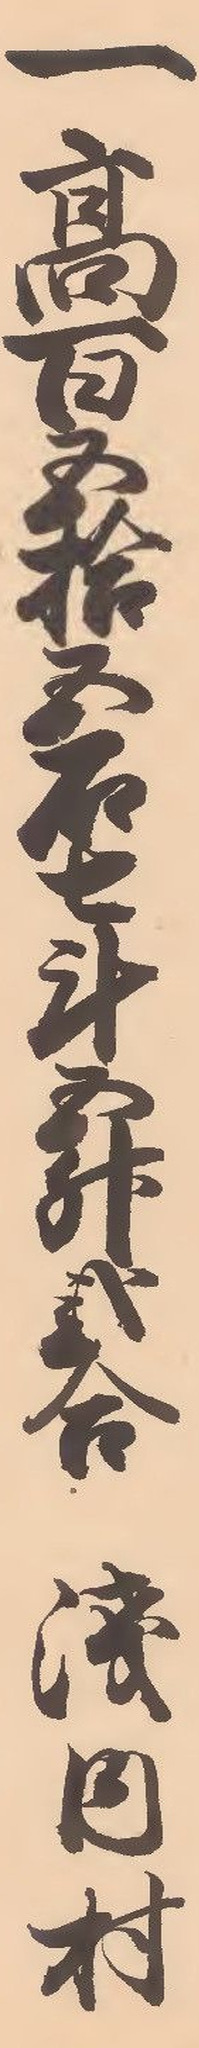一高百五拾五石七斗五升弐合浅内村
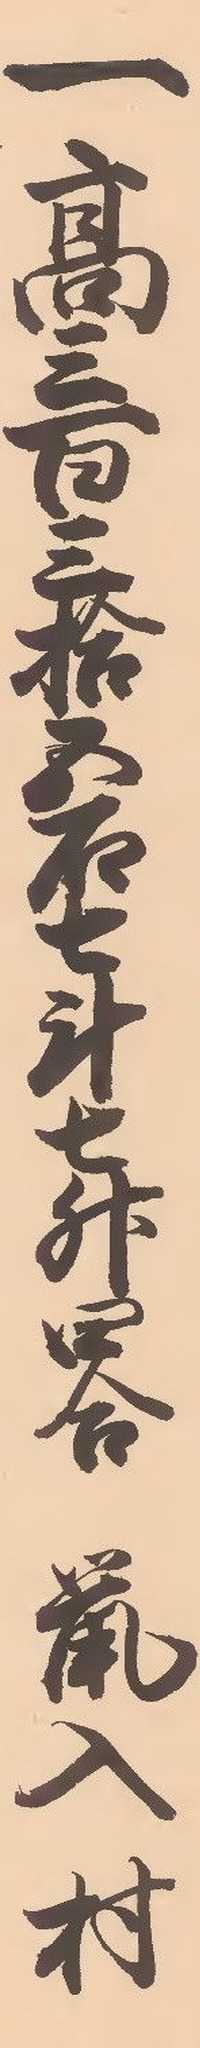一高三百三拾五石七斗七升四合鼠入村
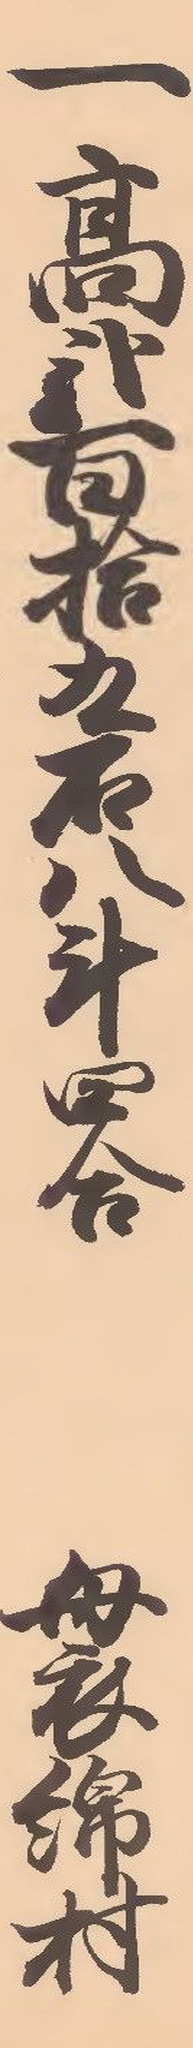一高弐百拾九石八斗四合袰綿村
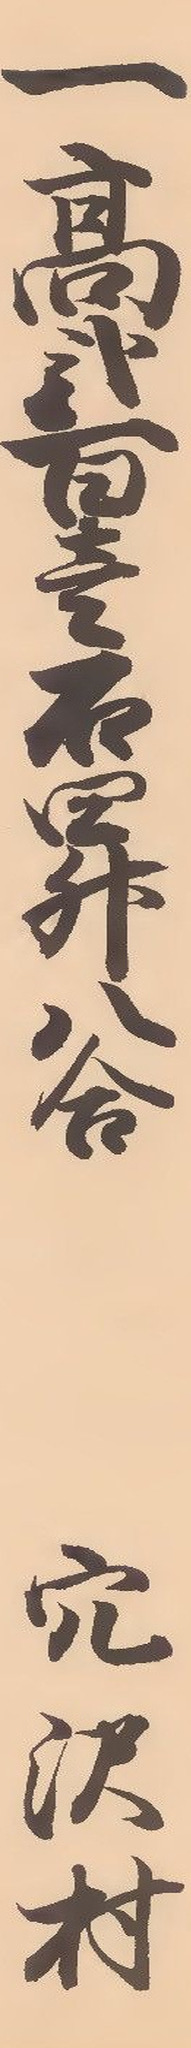一高弐百壱石四升八合穴沢村
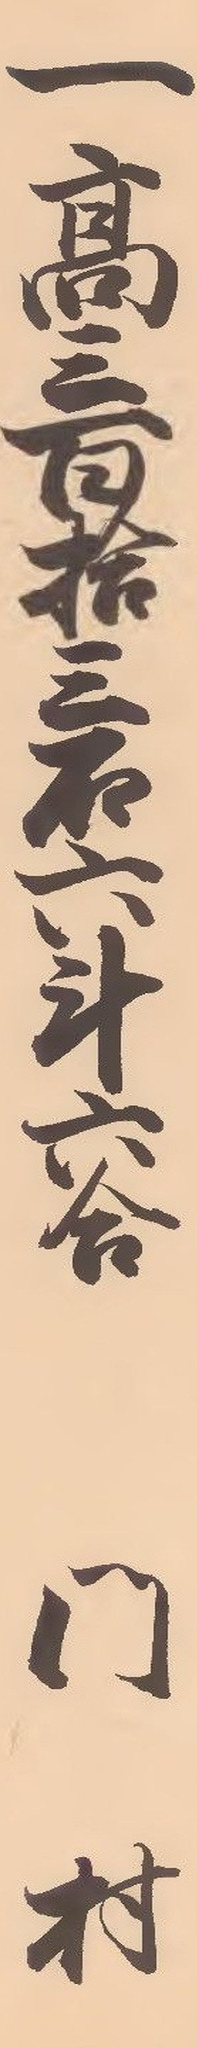一高三百拾三石六斗六合門村
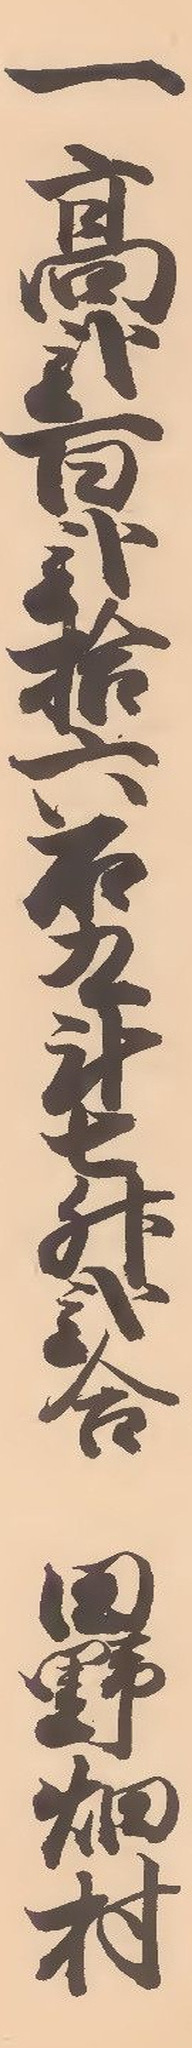一高弐百弐拾六石九斗七升弐合田野畑村

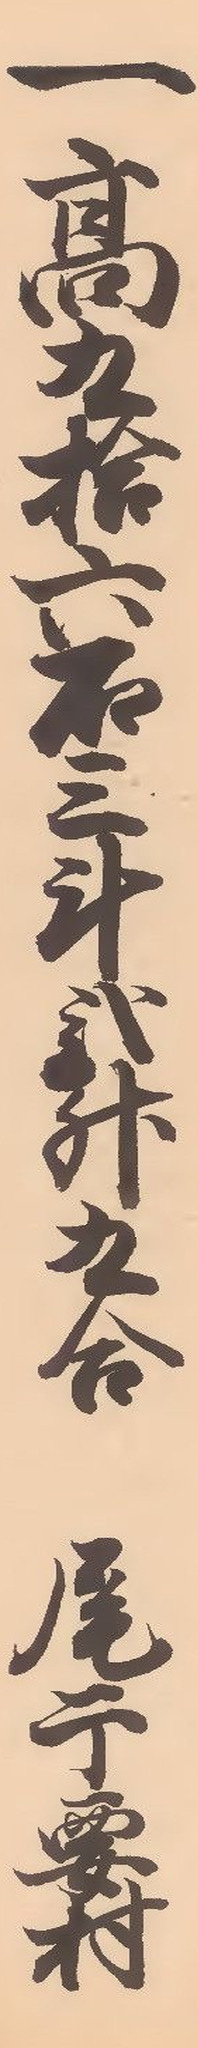一高九拾六名三斗弐升九合尾干要村
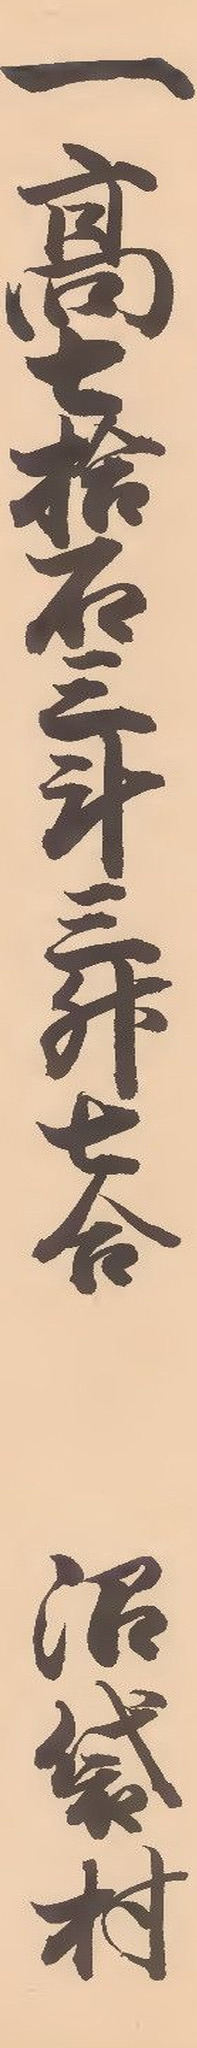一高七拾石三斗三升七合沼袋村
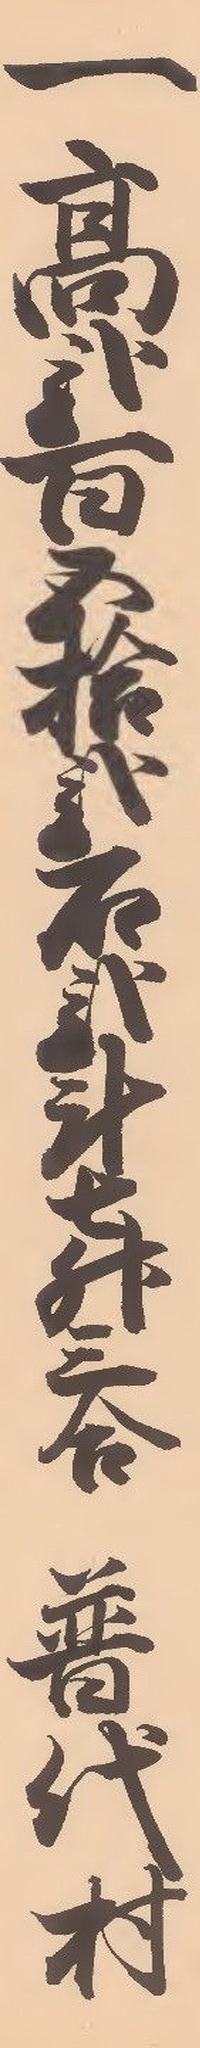一高弐百五拾弐石弐斗七升三合普代村
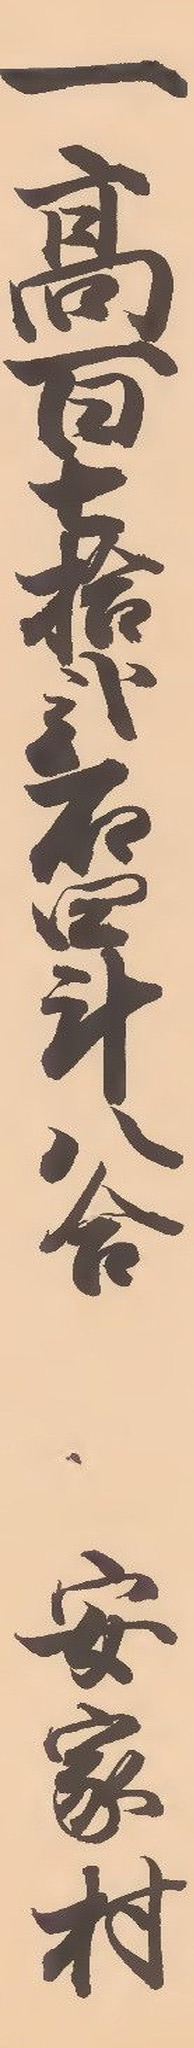一高百七拾弐石四斗八合安家村
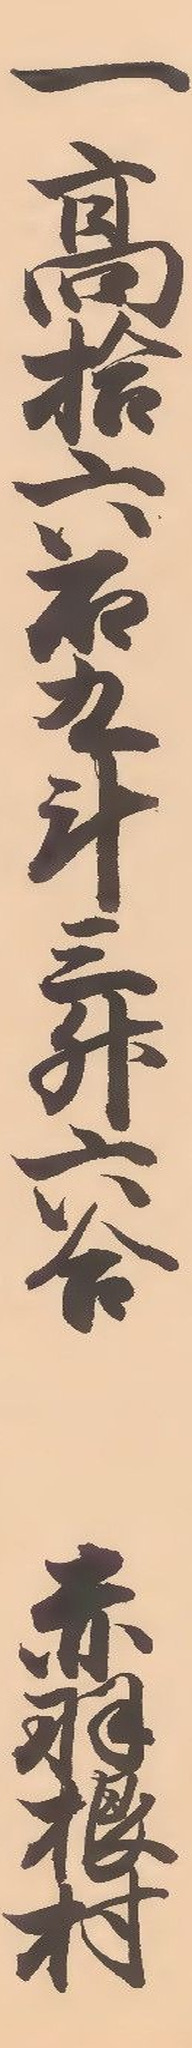一高拾六石九斗三升六合赤羽根村
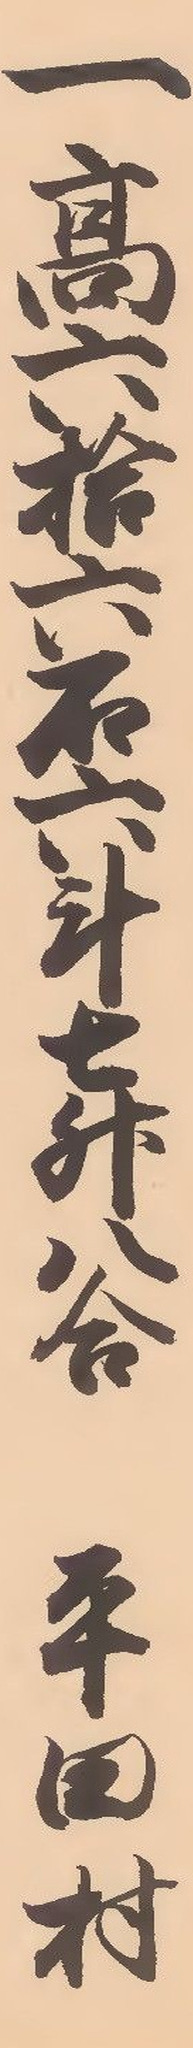一高六拾六石六斗七升八合平田村
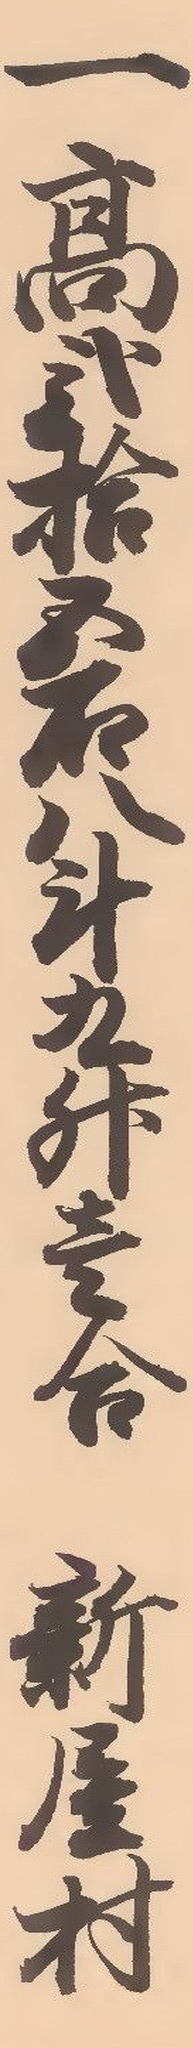一高弐拾五石八斗九升壱合新屋村
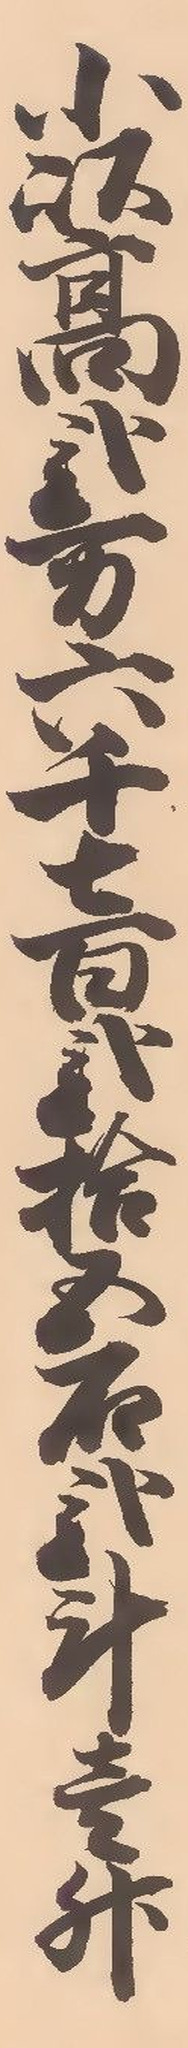小以高弐万六千七百弐拾五石弐斗壱升
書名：陸奥国郷帳　６
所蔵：国立公文書館 National Archives of Japan
